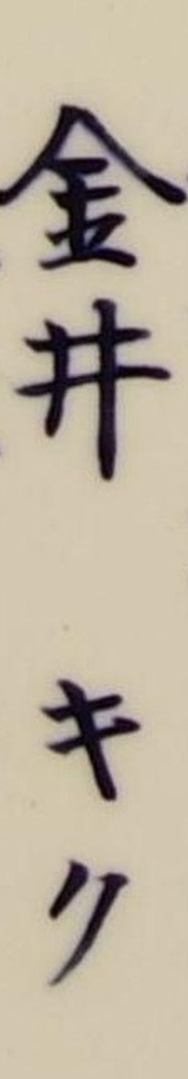金井キク
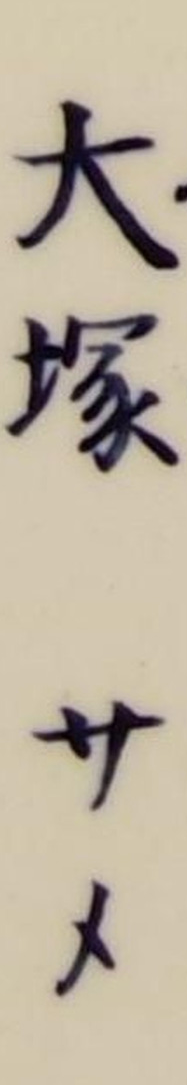大塚サメ
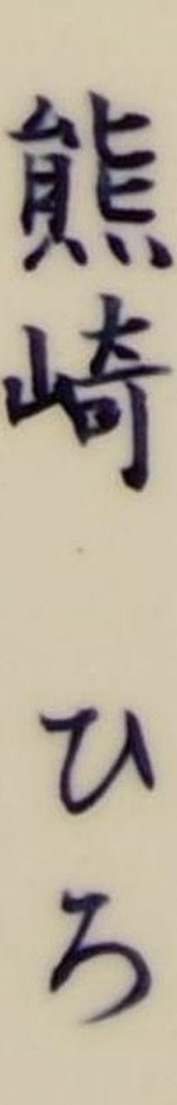熊崎ひろ
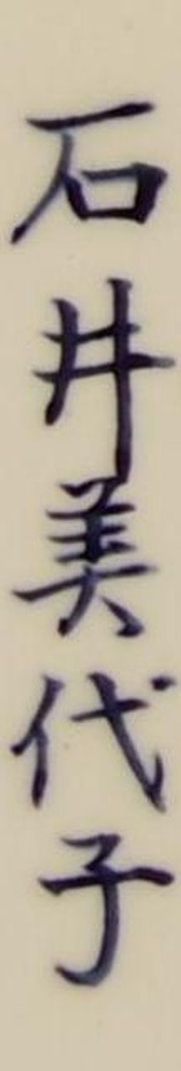石井美代子
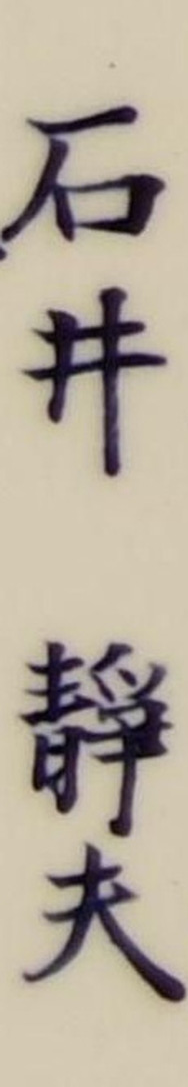石井静夫
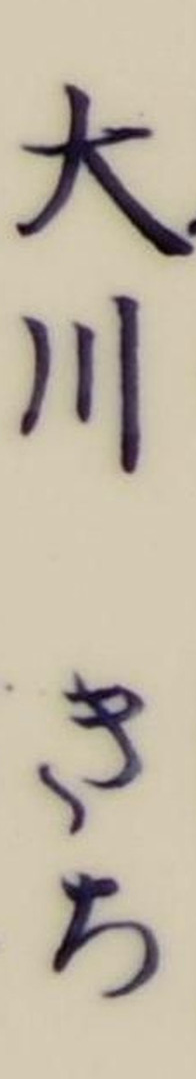大川きち
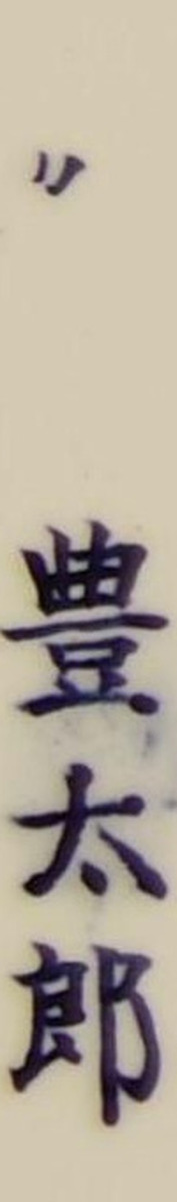豊太郎
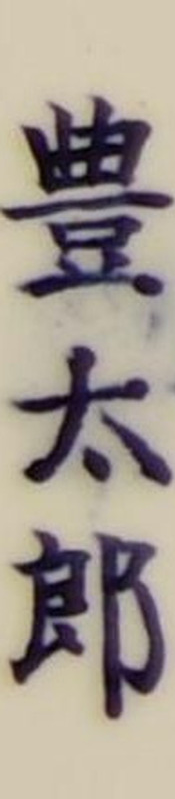豊太郎

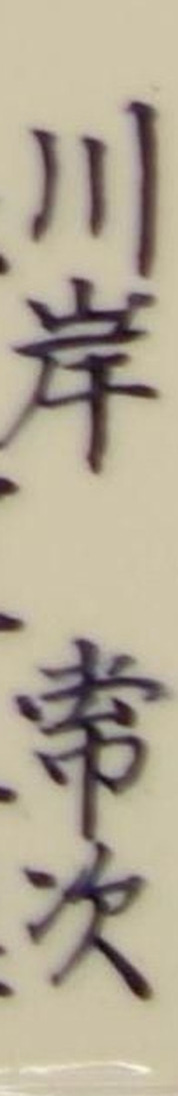川岸常次
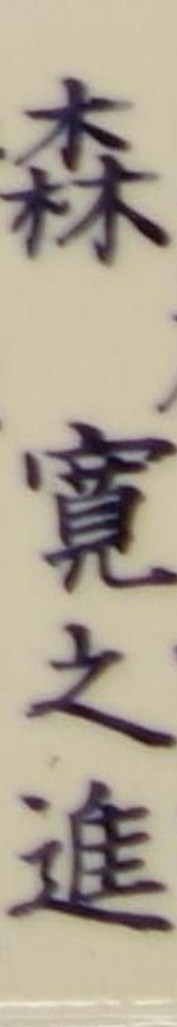森寛之進
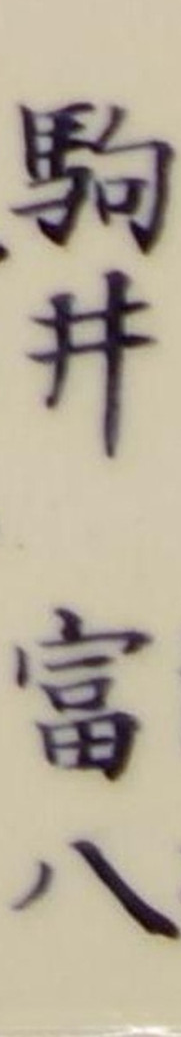駒井富八
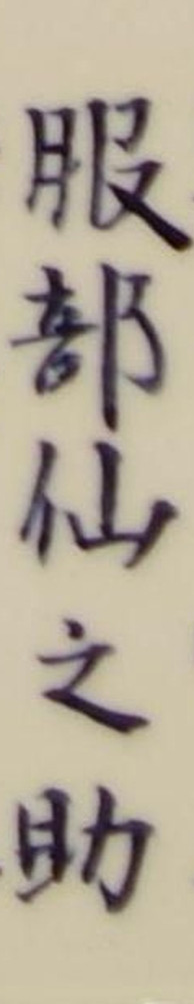服部仙之助
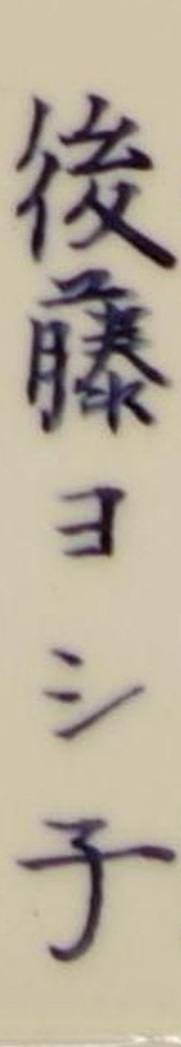後藤ヨシ子
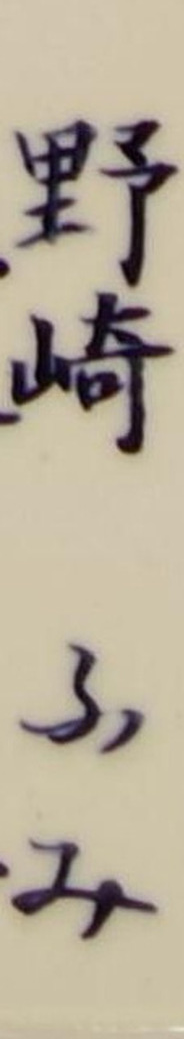野崎ふみ
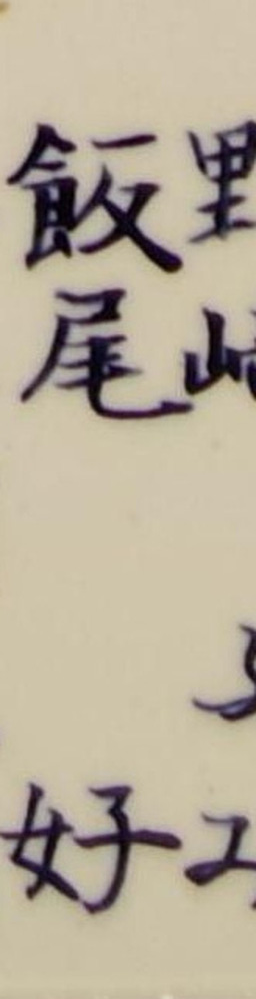飯尾好
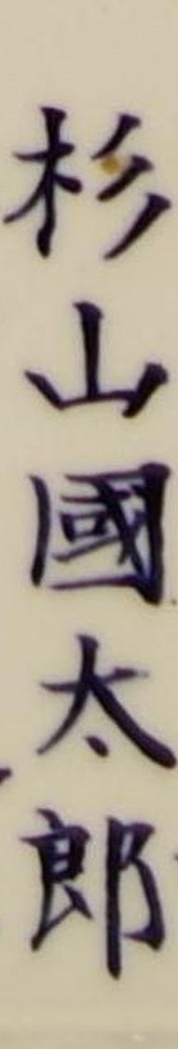杉山国太郎
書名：E~L
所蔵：高野山金剛峯寺
